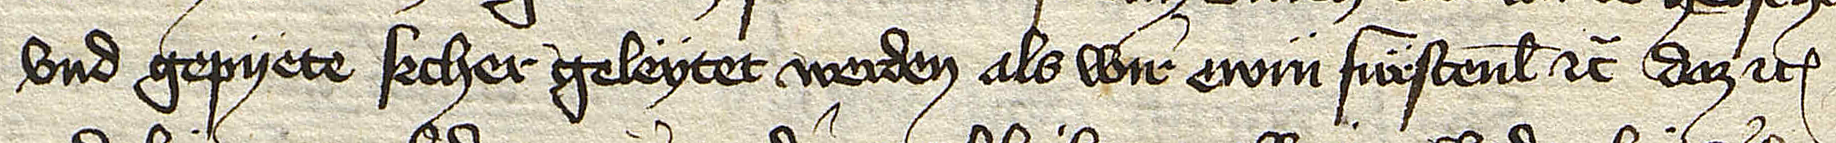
vnd gepyete ſicher geleytet werden als wir eẅrn fürſtenl* ec* daʒ ec*
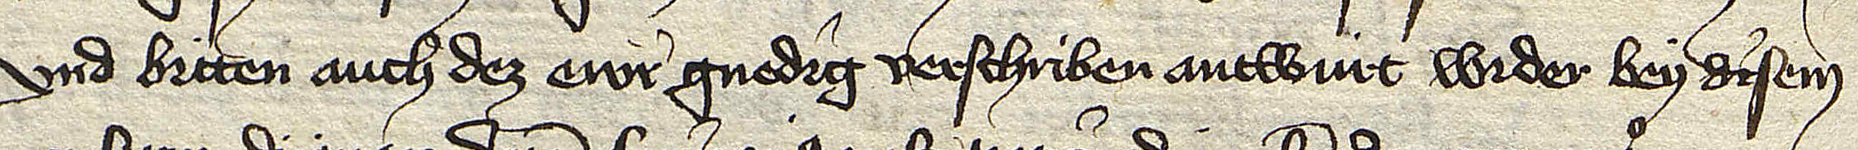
vnd bitten auch deʒ eẅr* gnedig verſchriben antwürt wider bey diſem
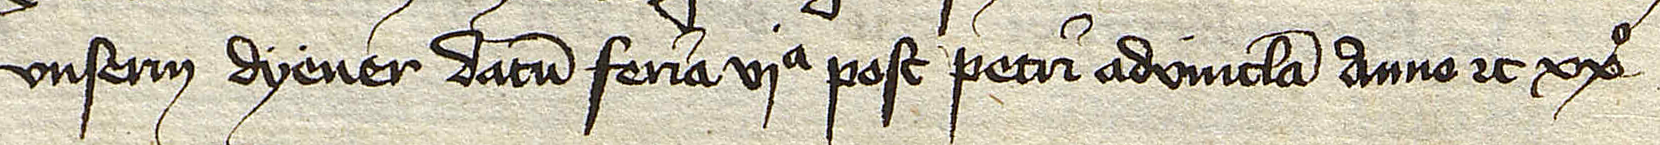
vnſerm dyener datu* feria vi* poſt petri advincla* Anno ec* xx*
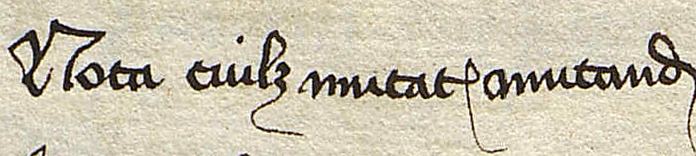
Nota cuil* mutat* mutand*
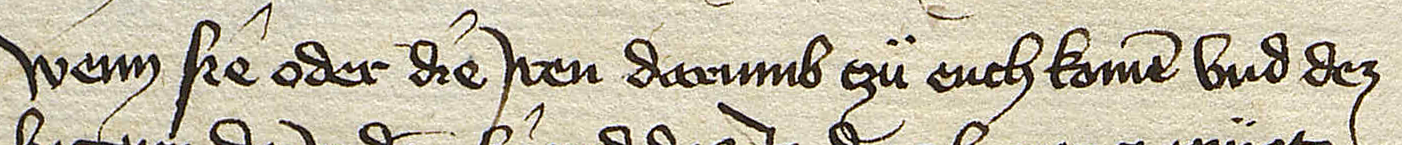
Wenn ſie oder die Iren darumb cʒü euch kome* vnd deʒ
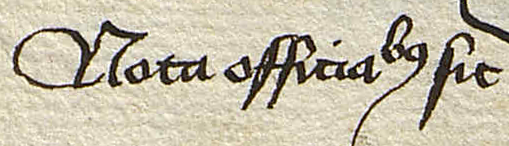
Nota officia* ſic
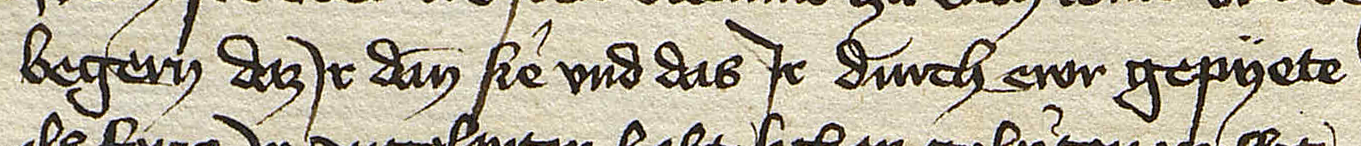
begern daʒ Ir dan* ſie vnd das Ir durch ewr gepyete
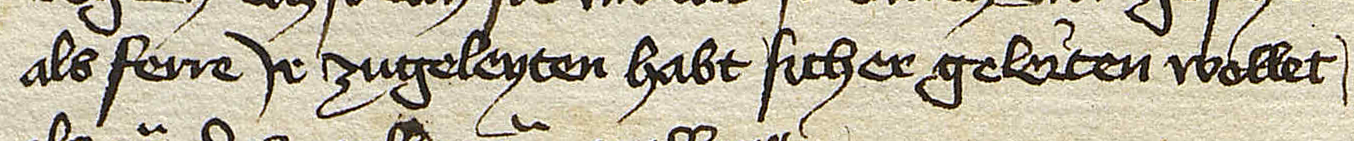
als ferre Ir cʒugeleyten habt ſicher geleiten wollet /
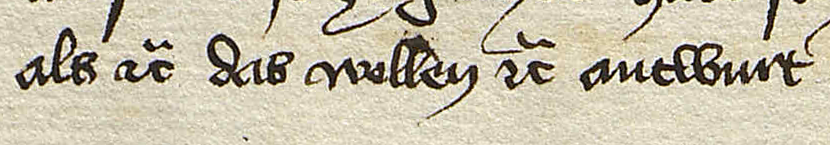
als ec* das wellen ec* antwurt
